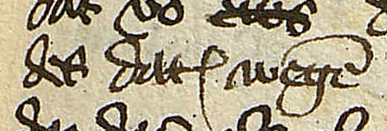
des dat* wege*
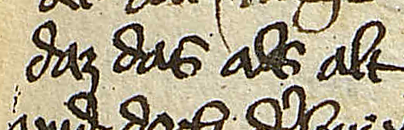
daʒ das als alt
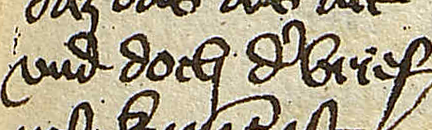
vnd doch d* brief
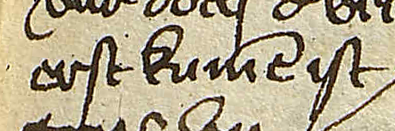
erſt kume* iſt
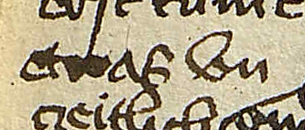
etwas vn
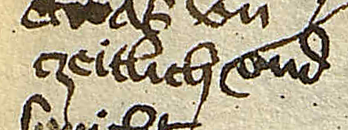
cʒeitlich vnd
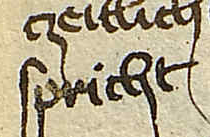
ſpricht
